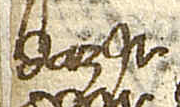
daʒ Ir
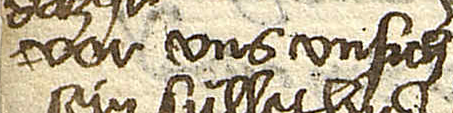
vor vns vnſich*
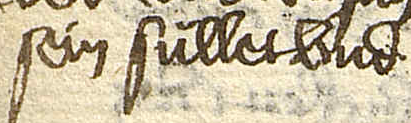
ſein ſüllet vnd
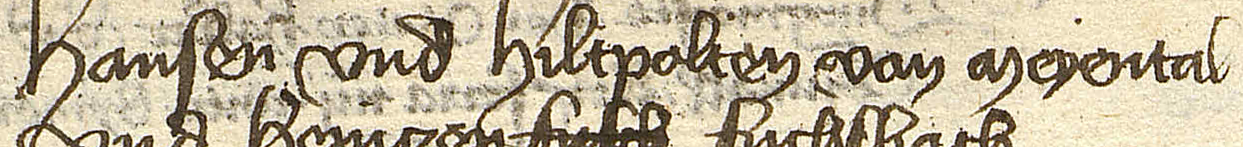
hanſen vnd hiltpolten von Meyental
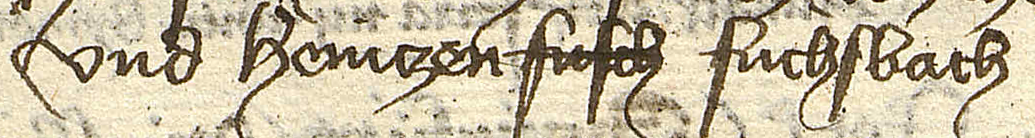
vnd heincʒen fuſch fuchſbach
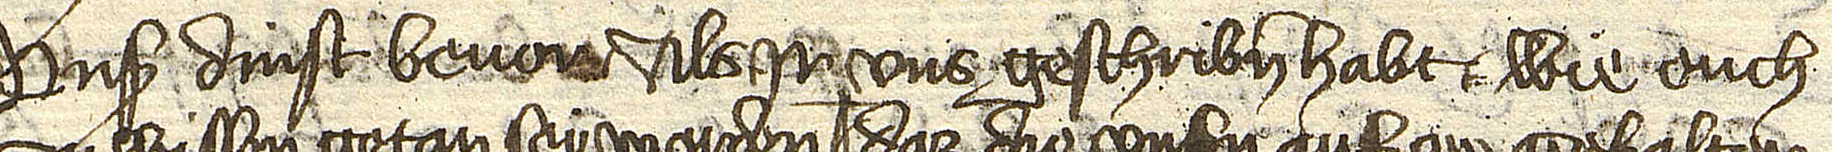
Vnſ* dinſt beuor / Als Ir vns geſchribn* habt / wie euch
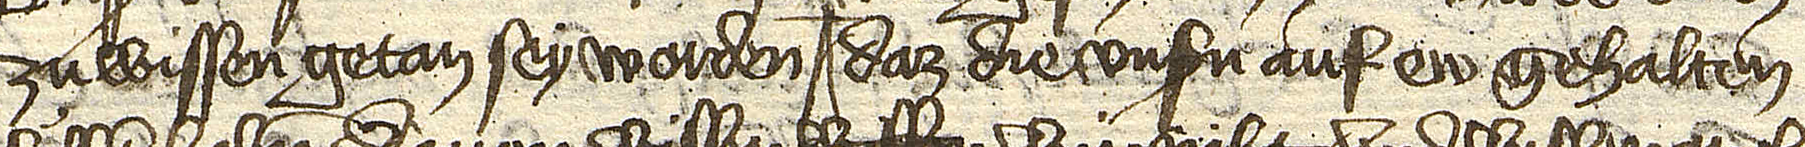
cʒu wiſſen getan ſey worden daʒ die vnſ*n auf ew gehalten
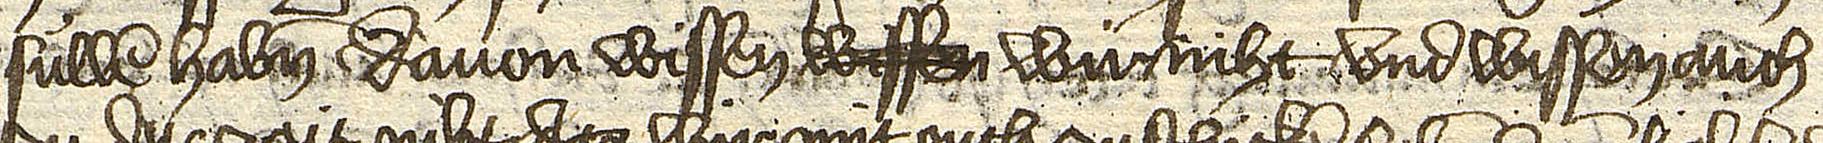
ſülle* habn* / dauon wiſſen wiſſen wir nicht vnd wiſſen auch
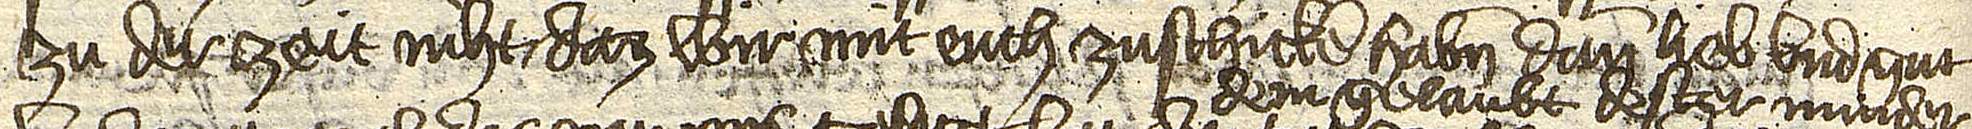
cʒu der cʒeit niht / daʒ wir mit euch cʒuſchicke* habn* dan* lieb vnd gut
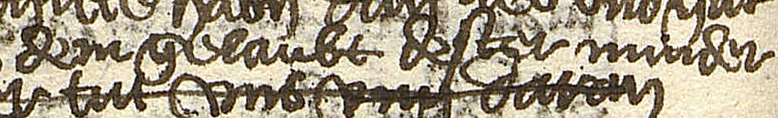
dem gelaubt deſter minder
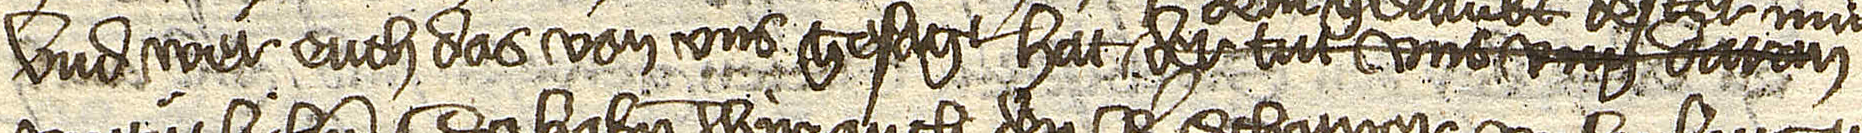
vnd wer euch das von vns geſagt hat / der tut vns vng daran
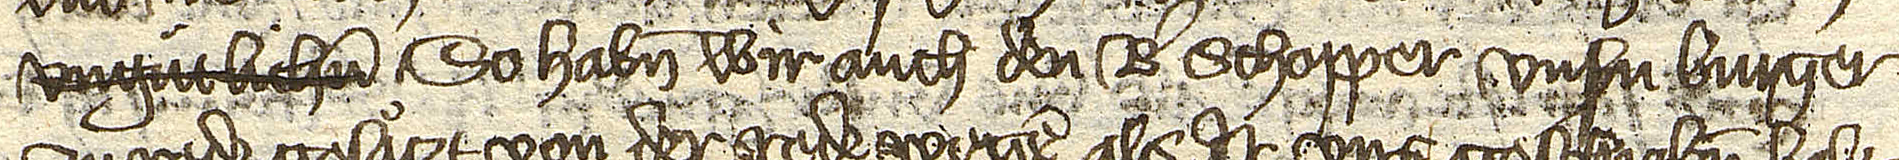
vngütlichn* / So habn* wir auch den B* Schopper vnſ*n burger
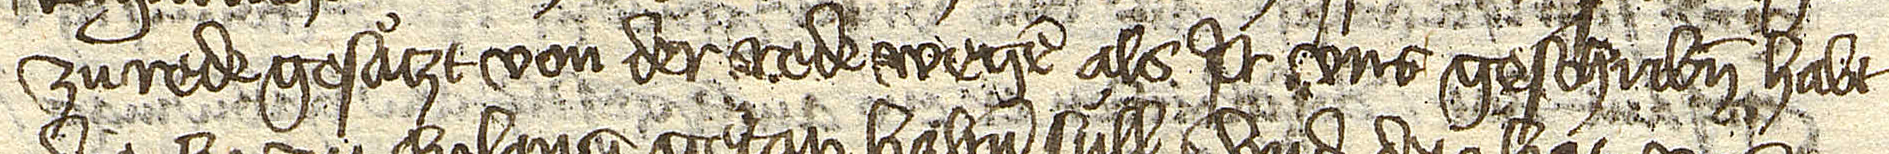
cʒu rede geſäcʒt von der rede wege* als Ir vns geſchribn* habt
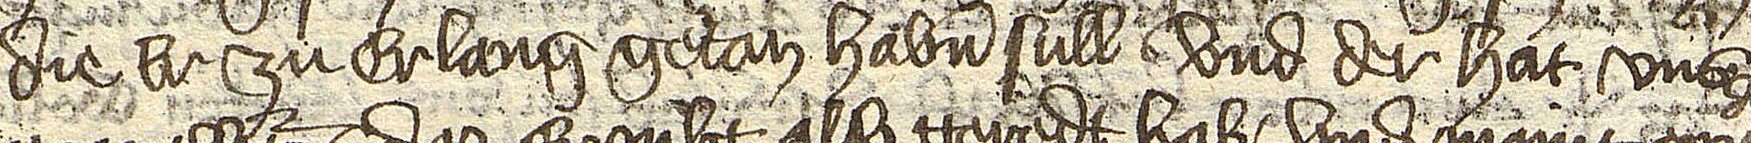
die Er cʒu Erlang getan habn* ſüll / vnd der hat vns
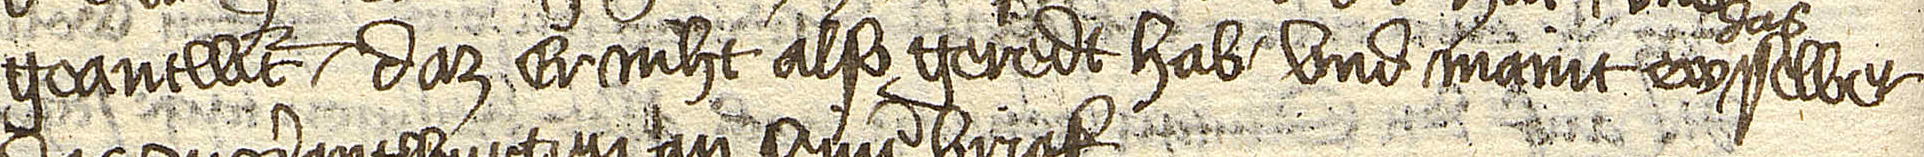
geantwt* / daʒ Er niht alſʒ geredt hab / vnd maint ew ſelber
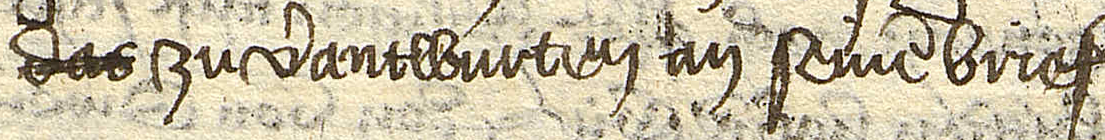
das cʒu v*antwurten an ſeine* brief
